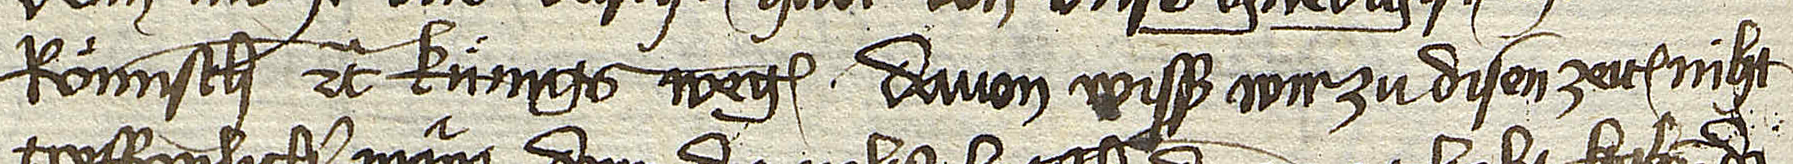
Römiſch ec* künigs weg* / Dauon wiſſ* wir ʒu diſen ʒeit* niht
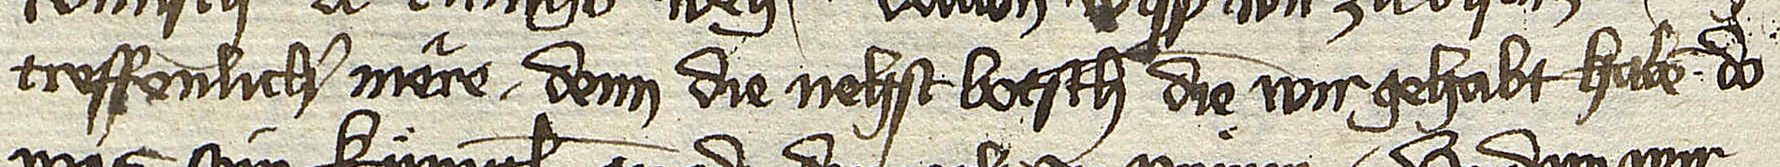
treffenlich* mëre / denn die nehſt botſch* die wir gehabt habe* . do
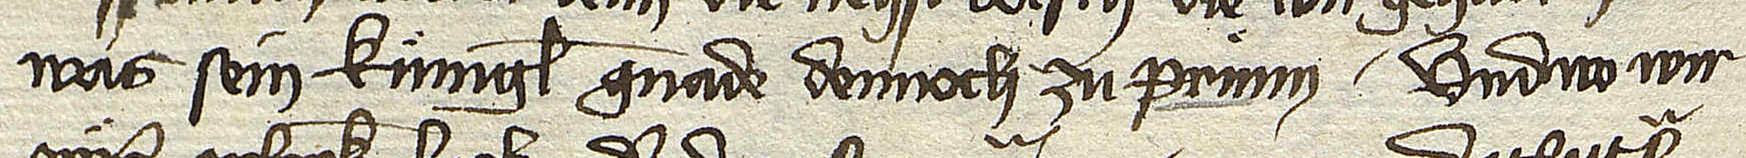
was ſein künigl* gnade dennoch ʒu Prünn / Vnd wo wir
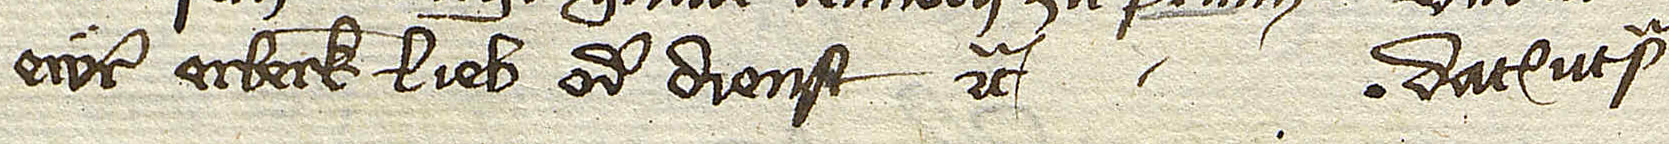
eẅr* erberk* lieb od* dienſt ec* / Dat* ut ſ*
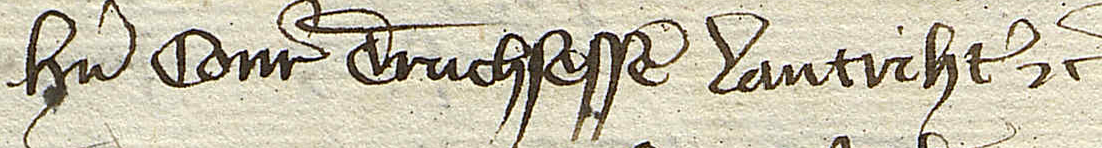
Hn* Conr* Truchſeſſe* lantriht* ec*
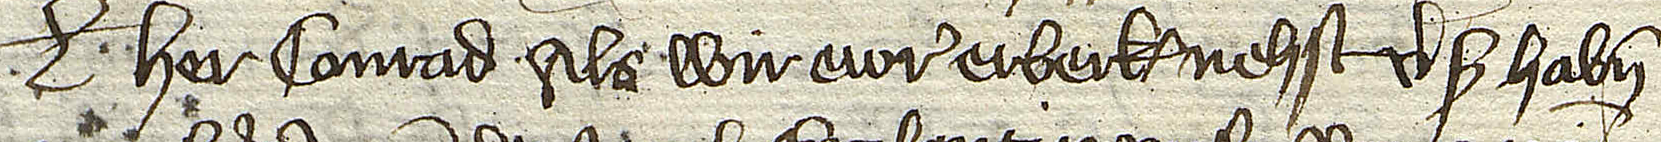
L* her Conrad . Als wir ewr* erberk* nehſt v*ſ* hab*n
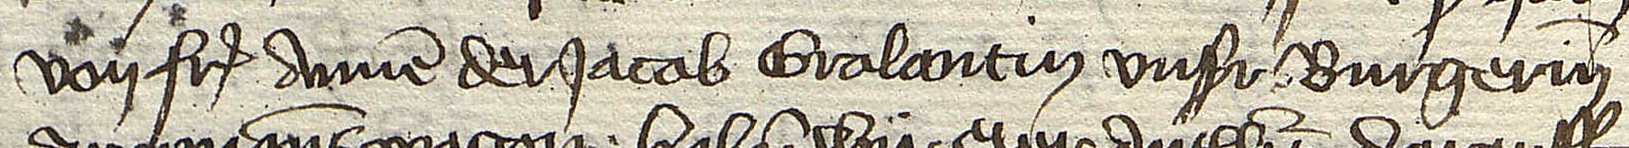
von fr* Anne* der Iacob Grolantin vnſ*r Burgerin*
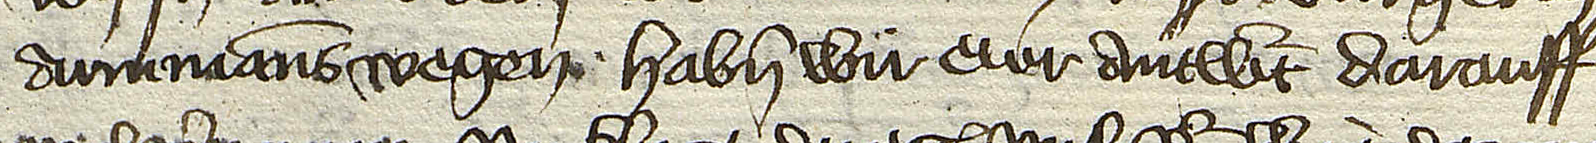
Armmans* wegen . hab*n wir ewr Antw*t darauff
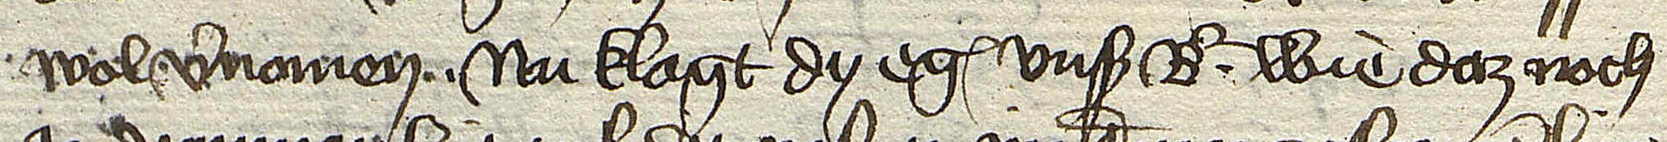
wol v*nomen . Nu klagt dy eg* vnſ* B* . wie daʒ noch
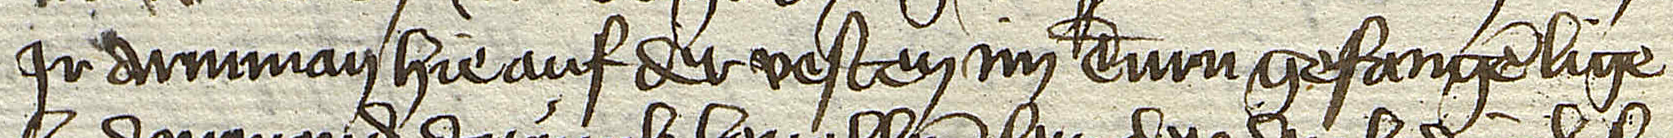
Ir Armman hie auf der veſten im Turn gefange* lige
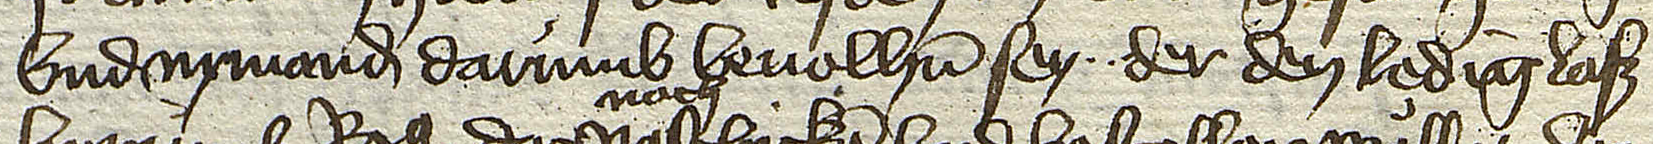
vnd nymand* darümb beuolh*n ſey ~ der den ledig laſʒ
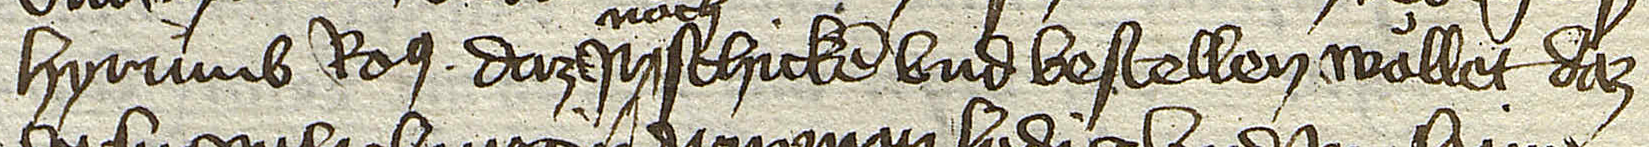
hyrümb Ro* . daʒ Ir ſchicke* vnd beſtellen wöllet daʒ
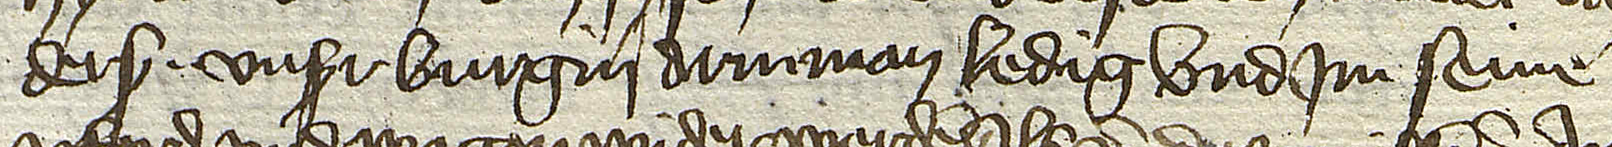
derſ* ~ vnſ*r burgin* Armman ledig vnd Im ſeine
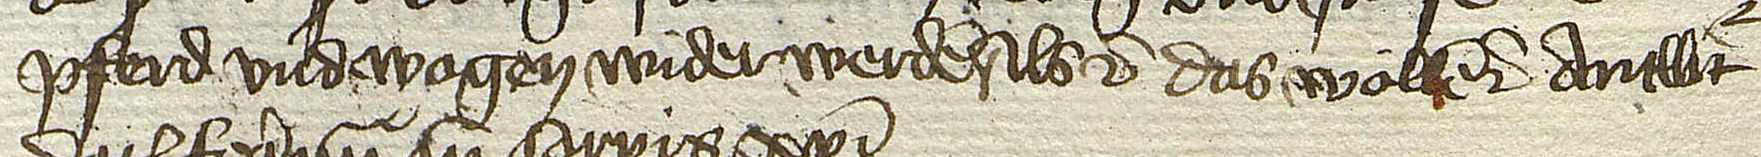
pferd vnd wagen wider werde* Als ec* das wölle* ec* Antw*t
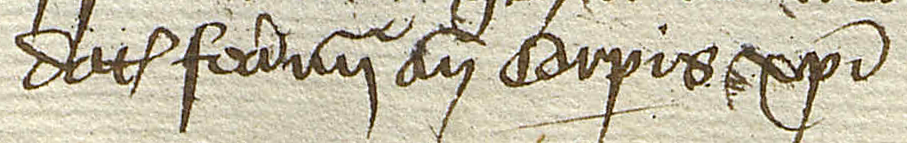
dat* fea* iiii* an* Corpis* xpi*
